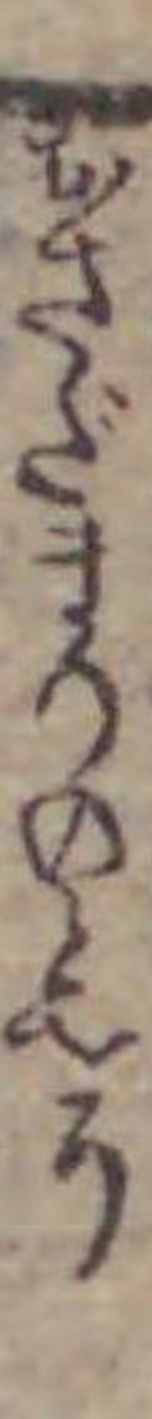おさだまりのしう
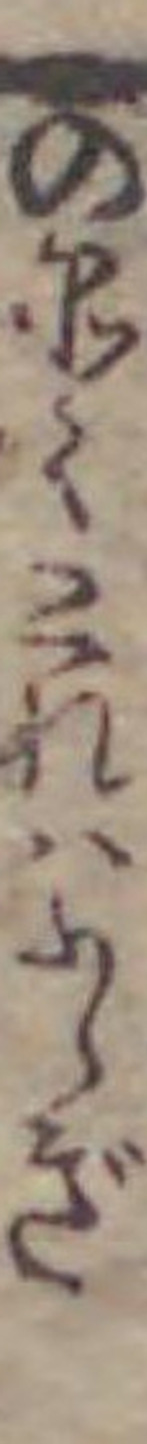の品々これはふしぎ
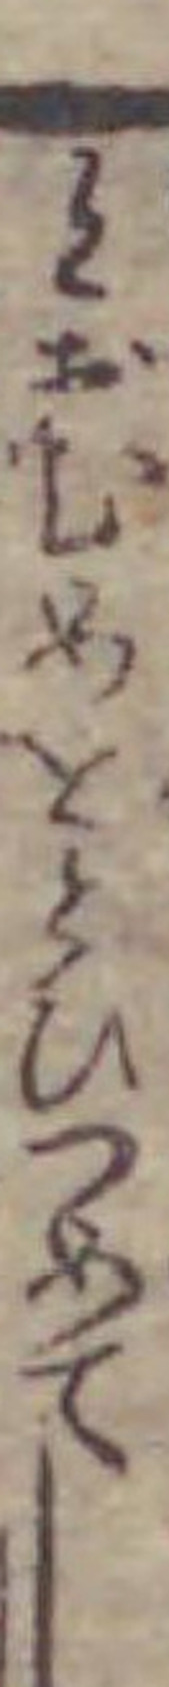とおむめをとひつめて
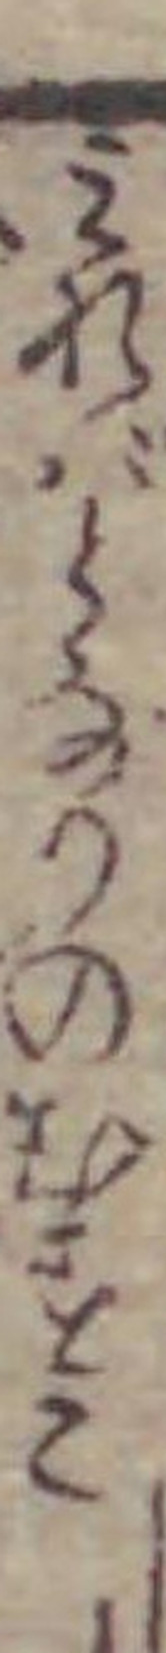みればとなりのむすこ
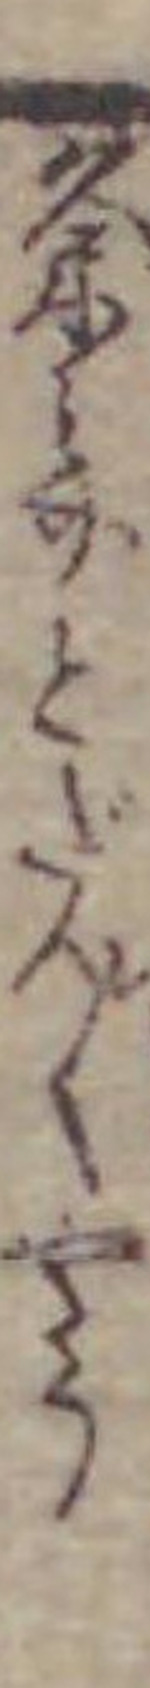久米之介とだん〴〵やう
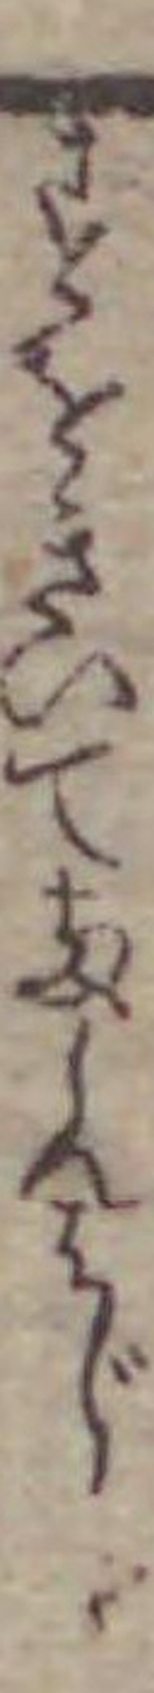すをきいて両しんはじ
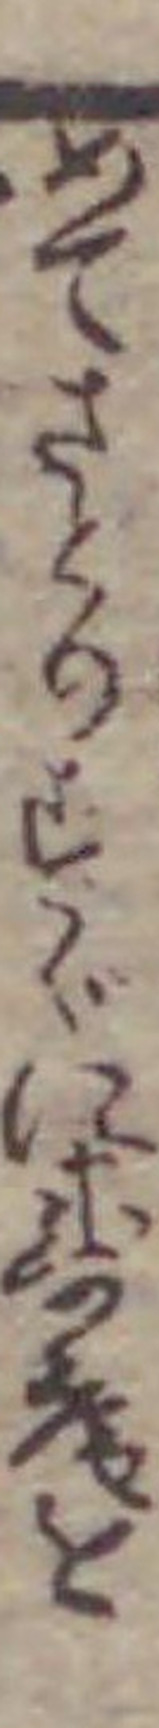めてさとりすぐに寿庵を
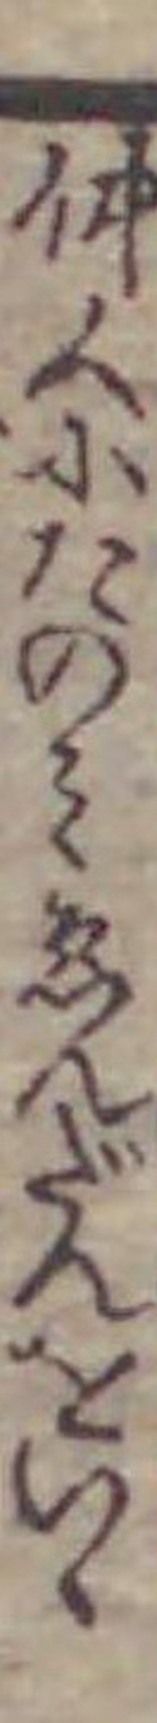仲人にたのみゑんだんをいゝ
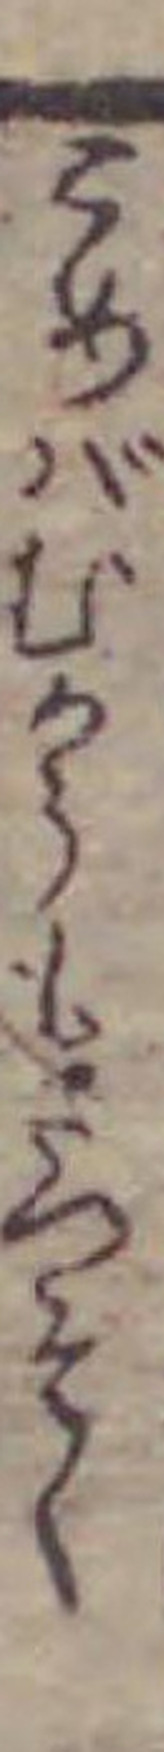こめばむかうもさつそく
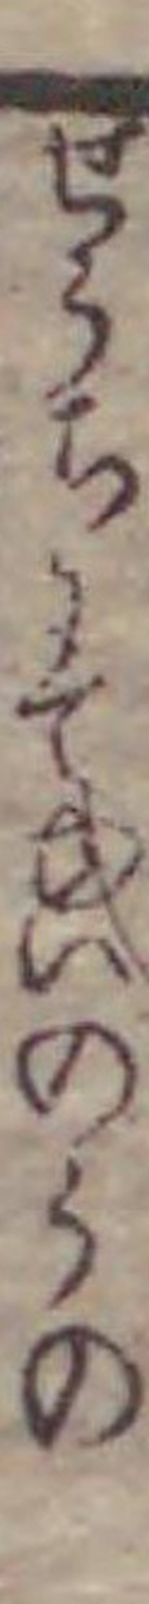せうちにてゆいのうの
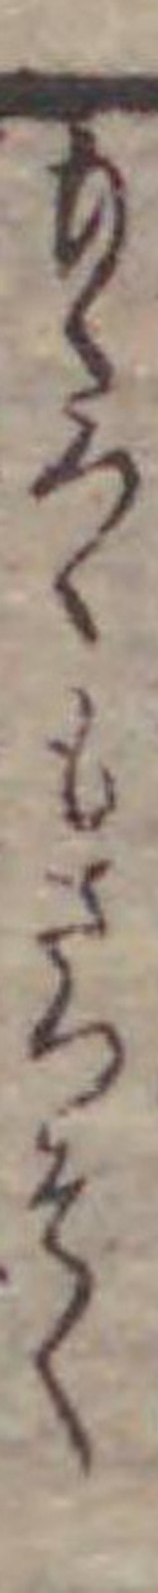もくろくもさつそく
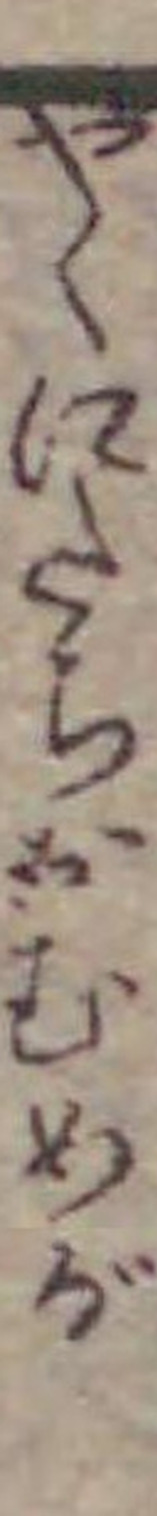やくにたちおむめが
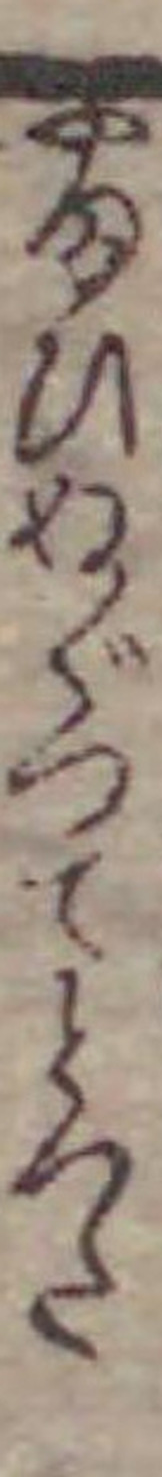やまひぬぐつてとつた
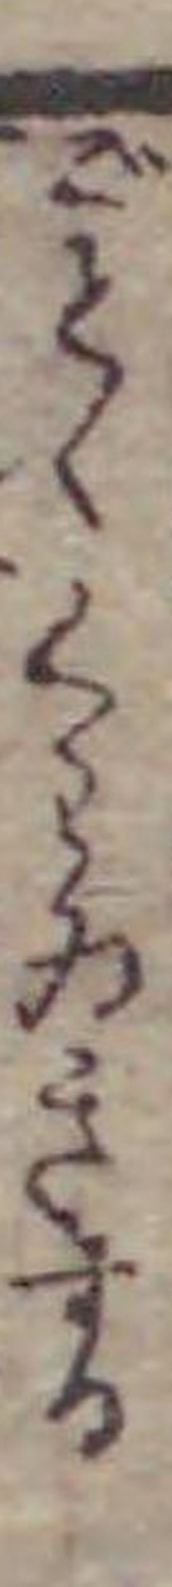ごとくくわゐきする
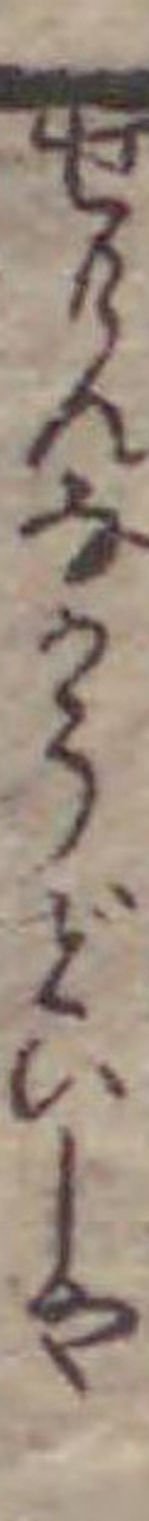せけんなかうどいしや
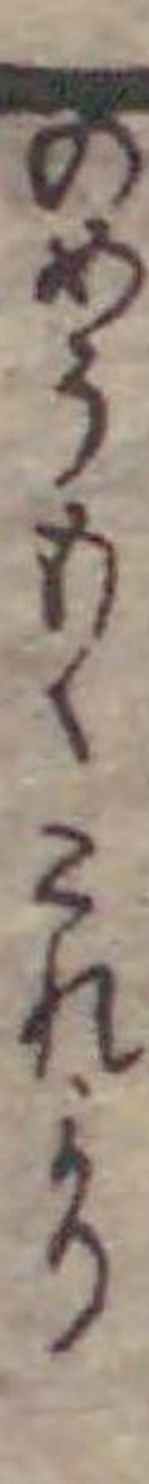のめうもくこれより
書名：鼻下長生薬 : 3巻
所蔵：国立国会図書館 National Diet Library, JAPAN
